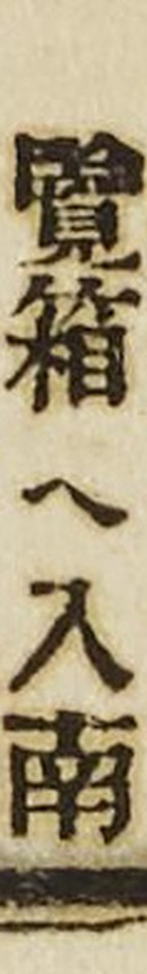覧箱へ入南
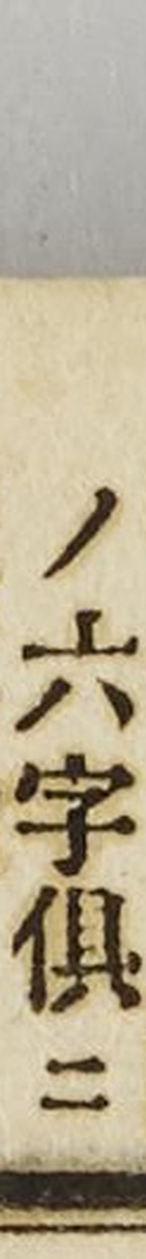ノ六字俱ニ
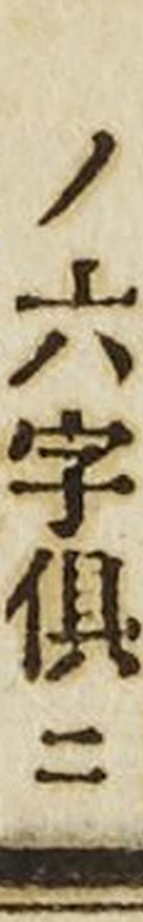ノ六字俱ニ
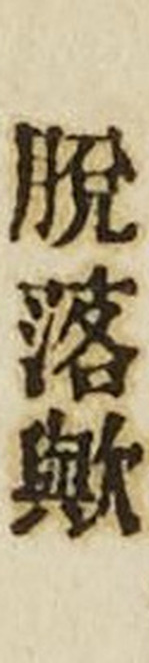脱落歟
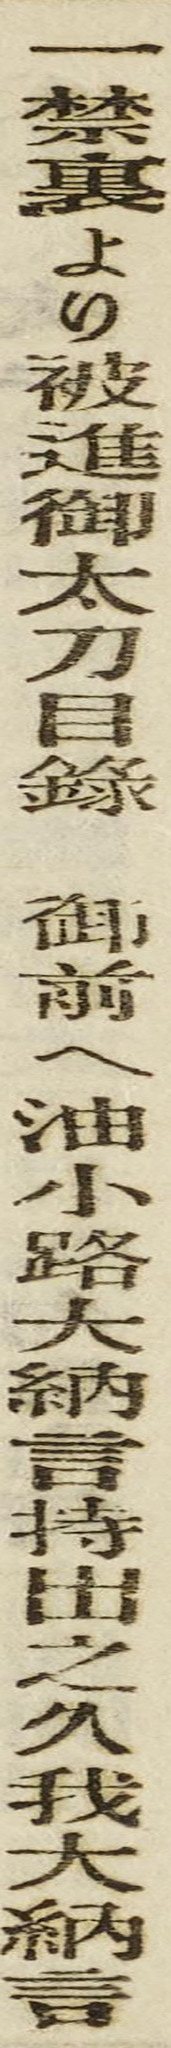一禁裏より被進御太刀目録御前へ油小路大納言持出之久我大納言
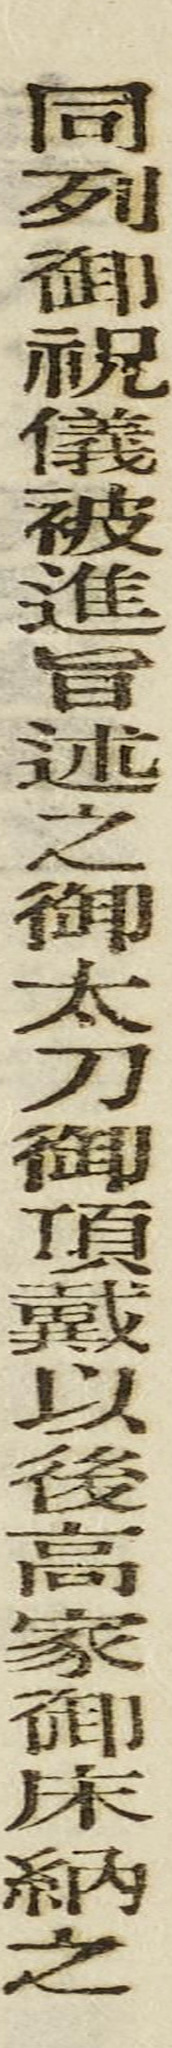同列御祝儀被進旨述之御太刀御頂戴以後高家御床納之
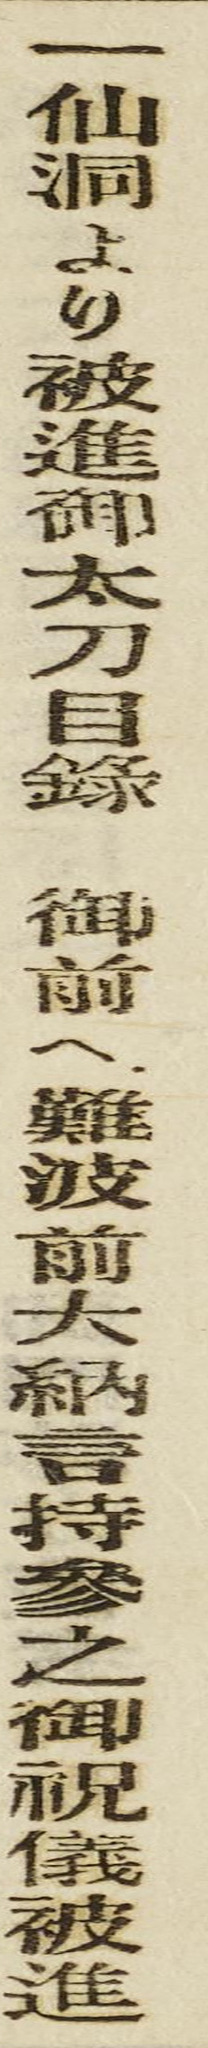一仙洞より被進御太刀目録御前へ難波前大納言持参之御祝儀被進
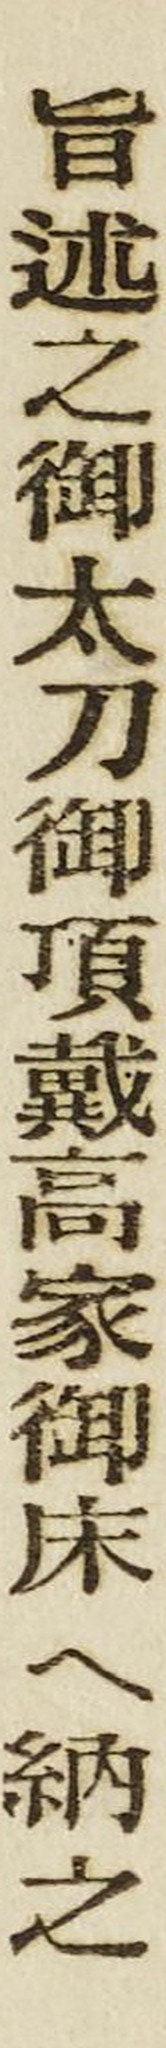旨述御太刀御頂戴高家御床へ納之
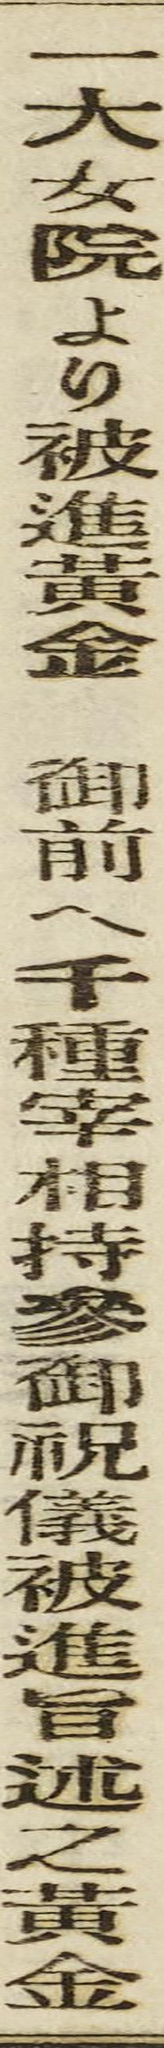一大女院より被進黄金御前へ千種宰相持参御祝儀被進旨述之黄金
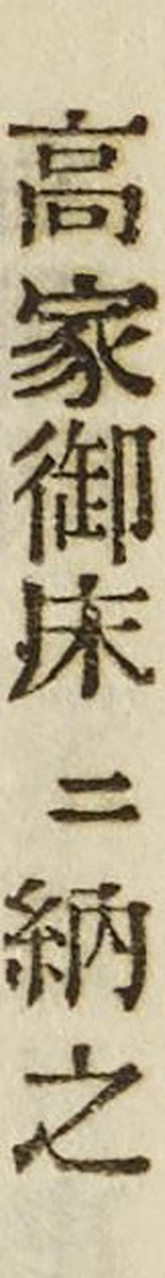高家御床ニ納之
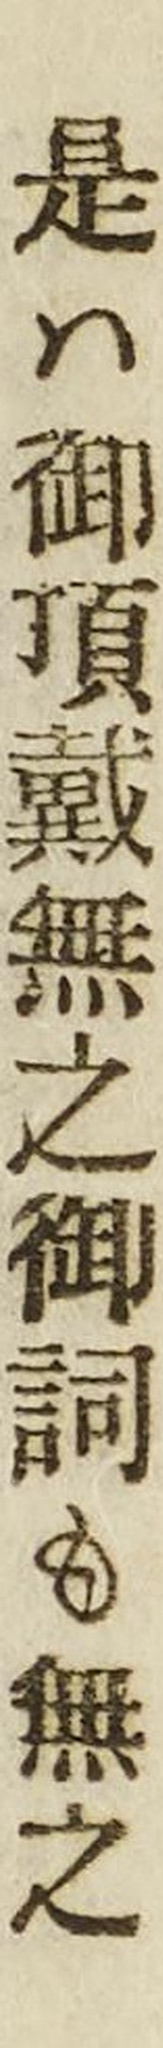是は御頂戴無之御詞も無之
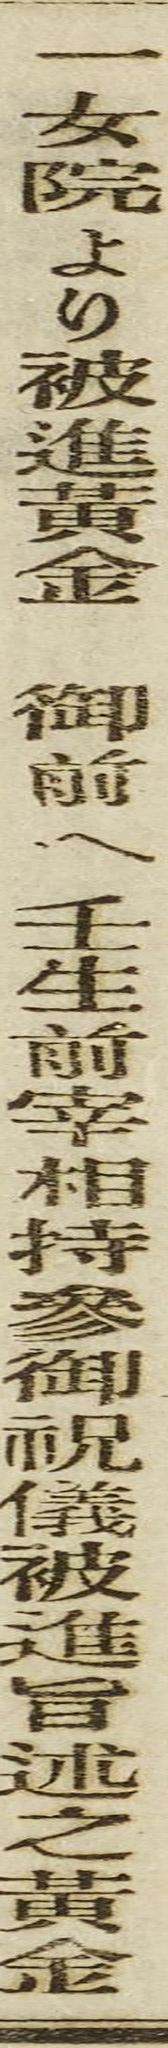一女院より被進黄金御前へ壬生前宰相持参御祝儀被進旨述之黄金

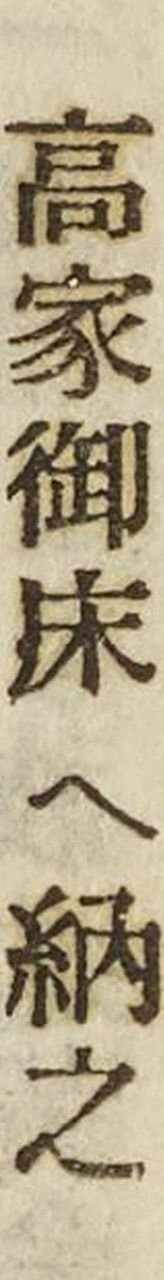高家御床へ納之
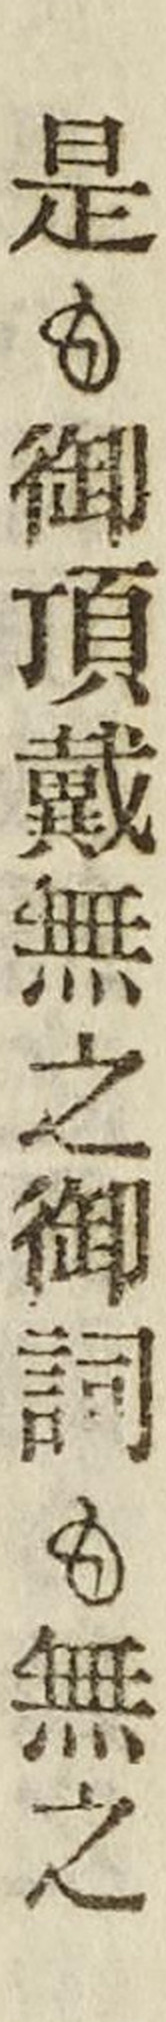是も御頂戴無之御詞も無之
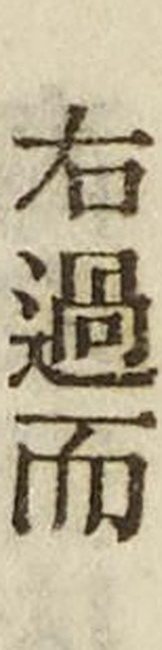右過而
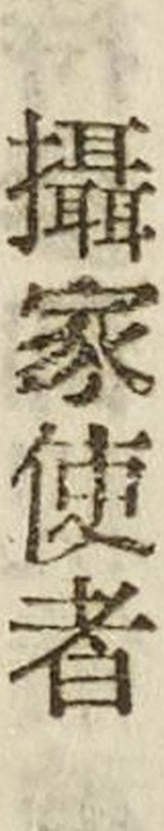摂家使者
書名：史籍集覽　朝鮮陣古文・細井廣澤記・颶風紀事・天明七年將軍宣下次第書　全
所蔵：東京大学地震研究所図書室 Earthquake Research Institute Library, The University of Tokyo, JAPAN
